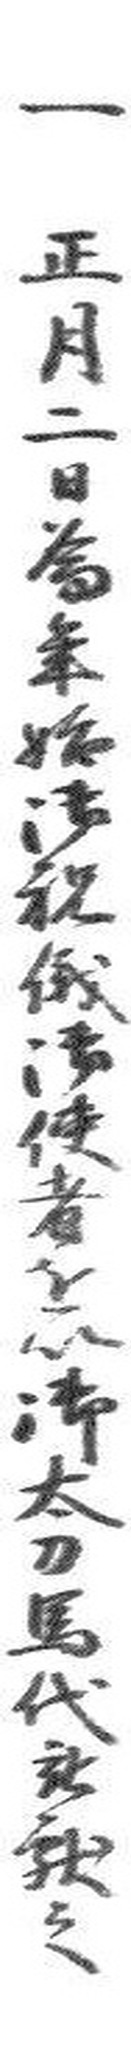一正月二日為年始御祝儀御使者を以御太刀馬代被献之
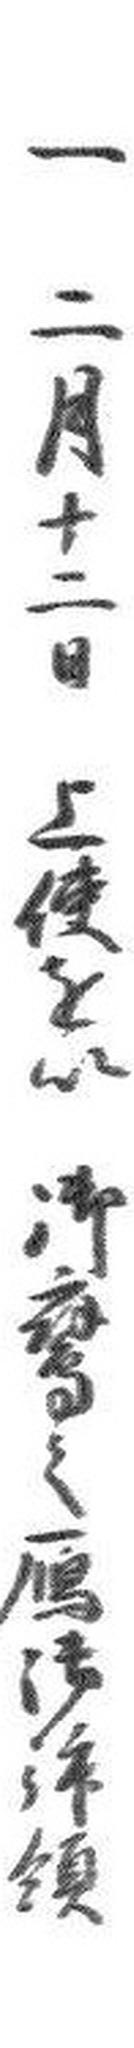一二月十二日上使を以御鷹之雁御拝領
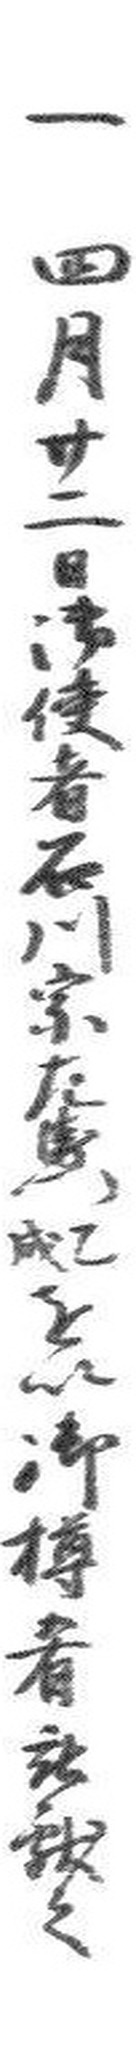一四月廿二日御使者石川宗左衛門乙成を以御樽肴被献之
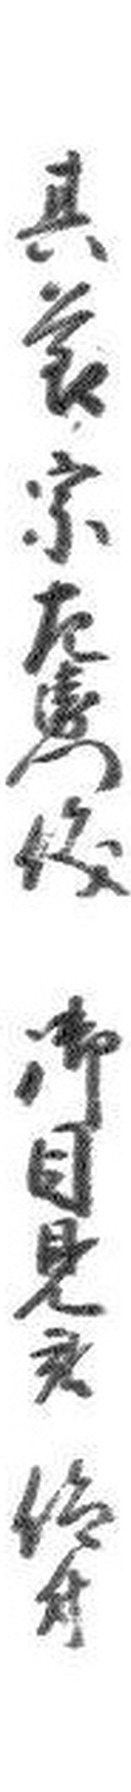其節宗左衛門儀御目見被仰付
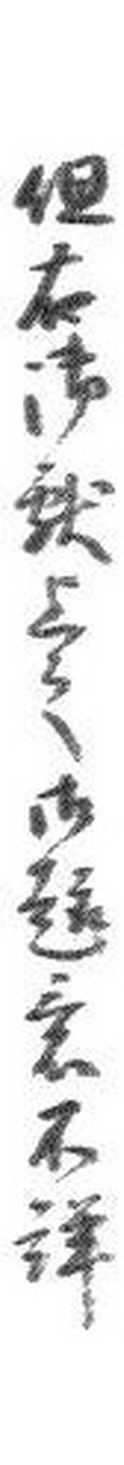但右御献上之御趣意不詳
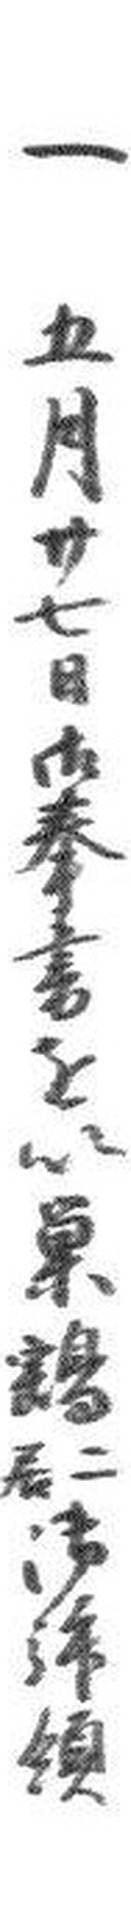一五月廿七日御奉書を以巣鷂二居御拝領

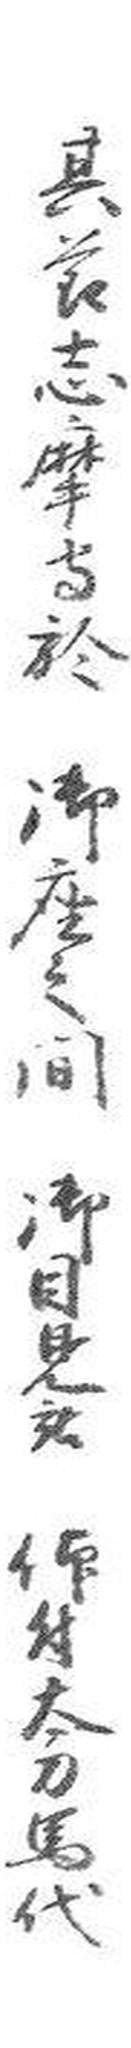其節志摩守於御座之間御目見被仰付太刀馬代
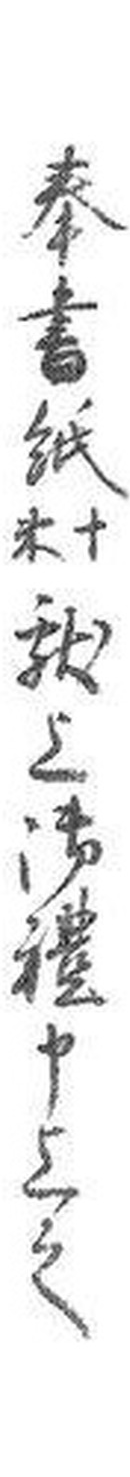奉書紙十束献上御礼申上之
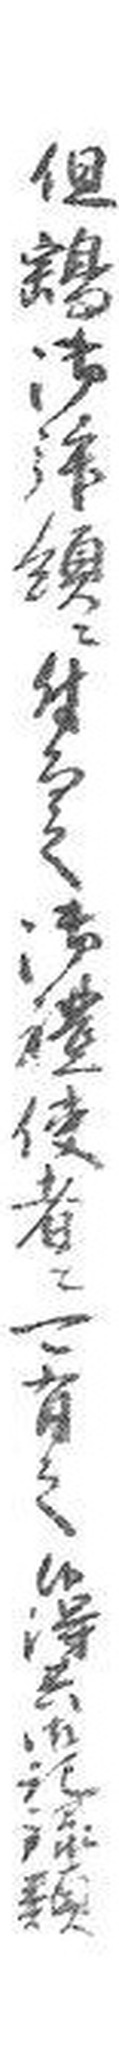但鷂御拝領ニ付而之御礼使者ニ可有之候得共御記録類
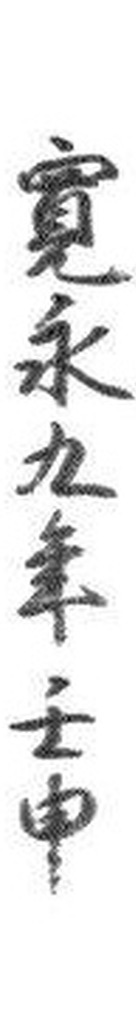寛永九年壬申
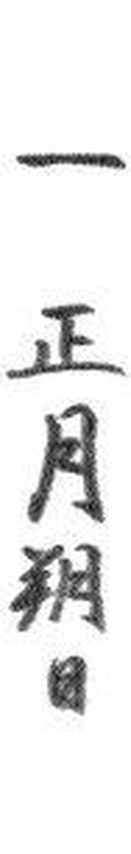一正月朔日
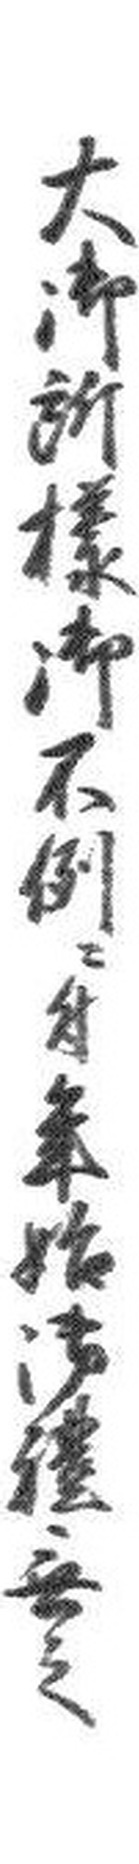大御所様御不例ニ付年始御礼無之
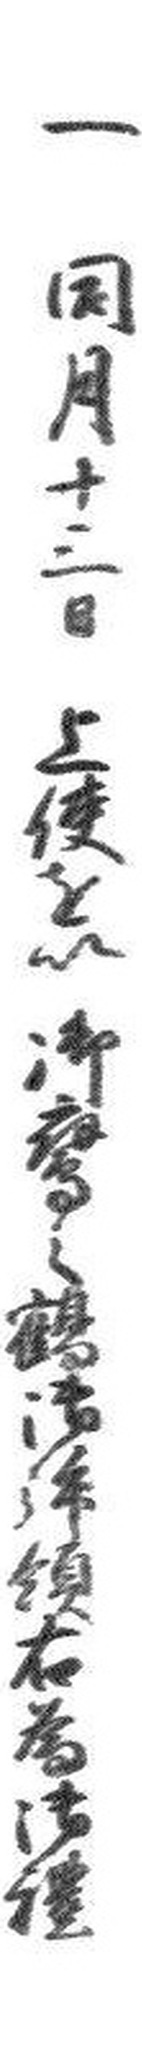一同月十三日上使を以御鷹之鶴御拝領右為御礼
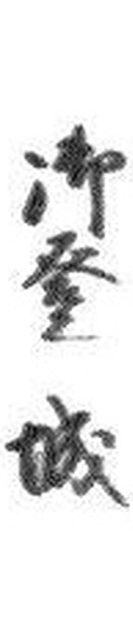御登城
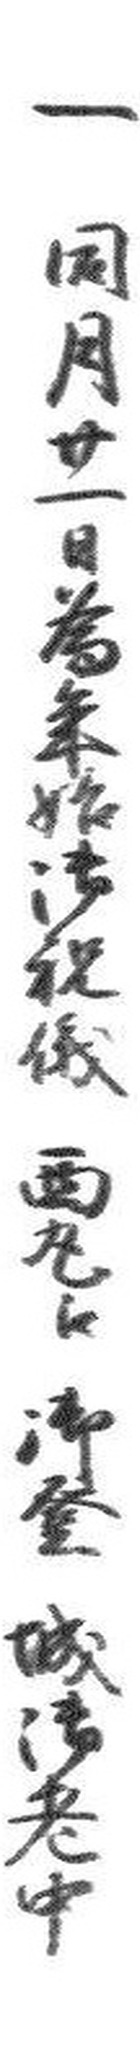一同月廿一日為年始御祝儀西丸江御登城御老中
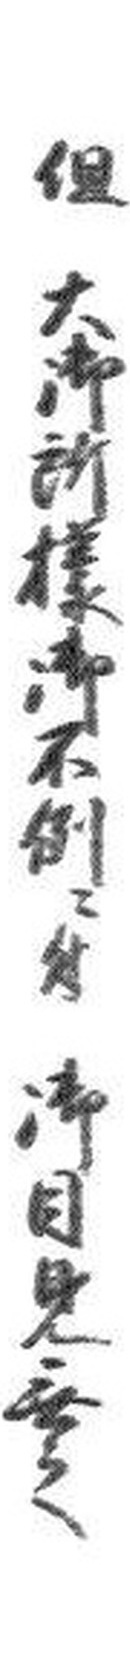但大御所様御不例ニ付御目見無之
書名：家譜 四 忠昌公 従寛永七年到正保四年
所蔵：福井県文書館 Fukui Prefectural Archives
